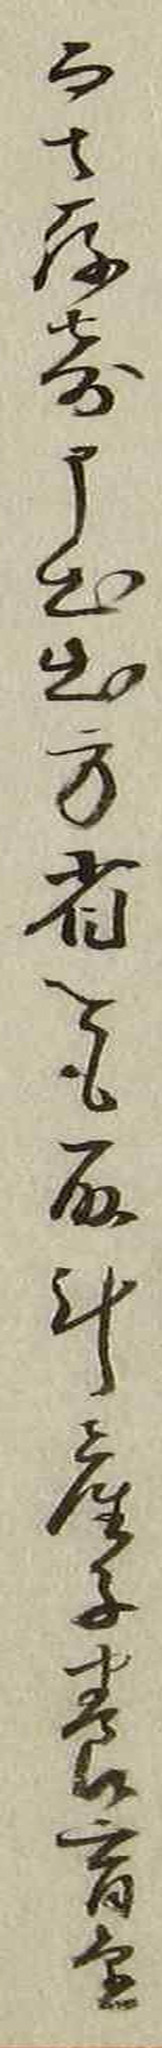而は存寄申出出方省をも取計産子養育金
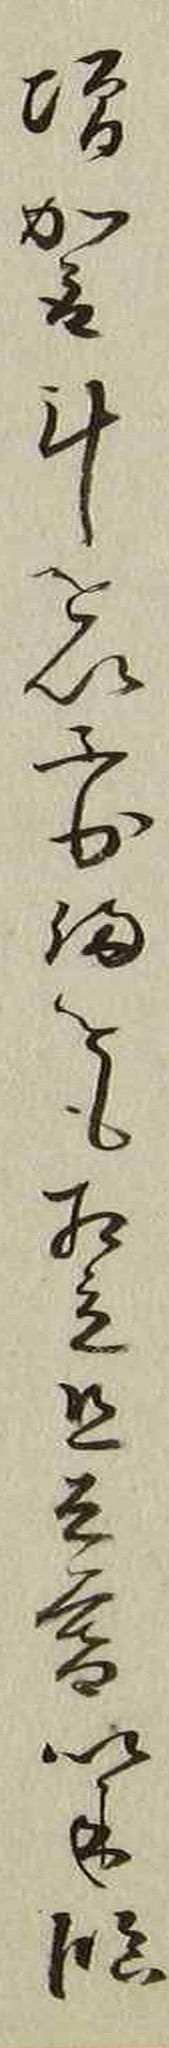増加取計を以ふかまをも相立且去暮以来臨
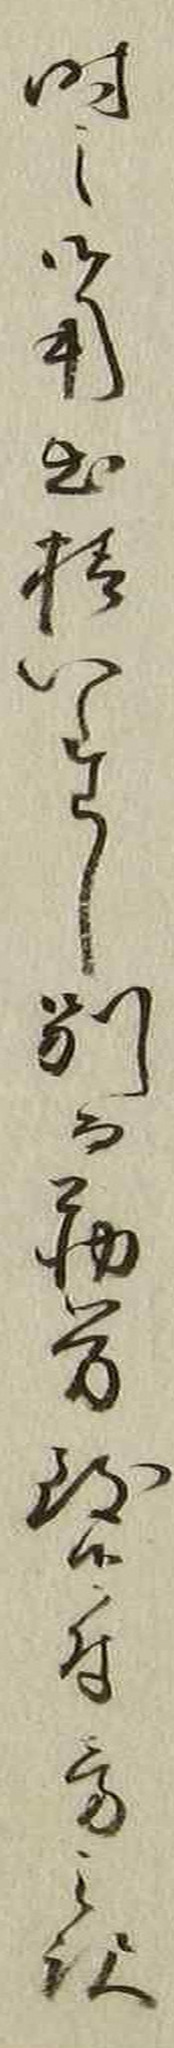時之御用出精いたし別而勤労致候ニ付旁之訳
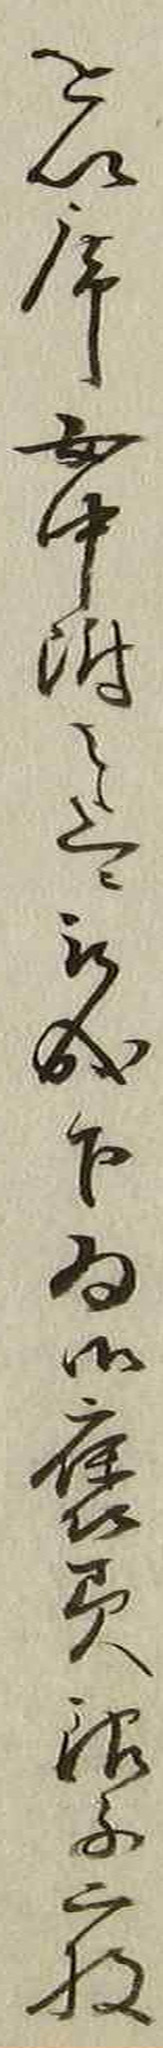を以席女中附之上ニ被成下為御褒美銀子二枚
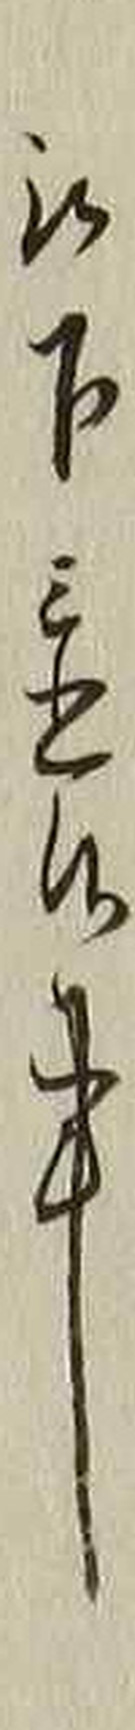被下置候事
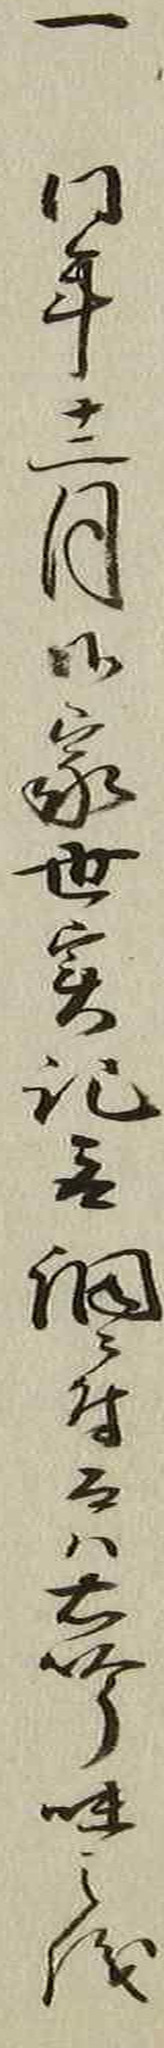一同年十二月御家世実記取調ニ付而は右吟味之儀
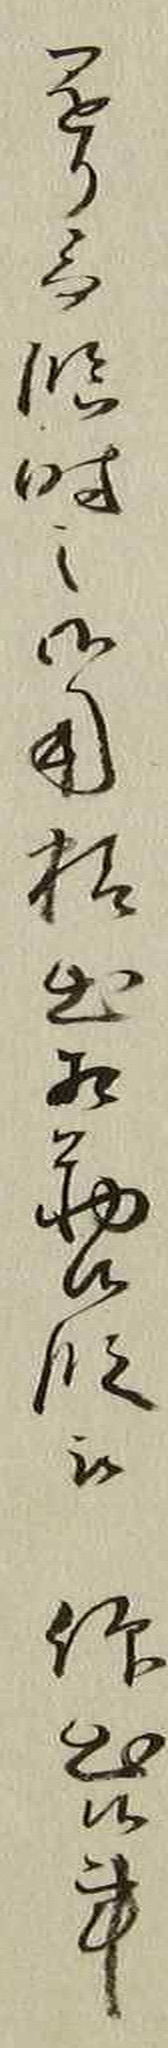懸りニ而臨時之御用精出相勤候段被仰出侯事
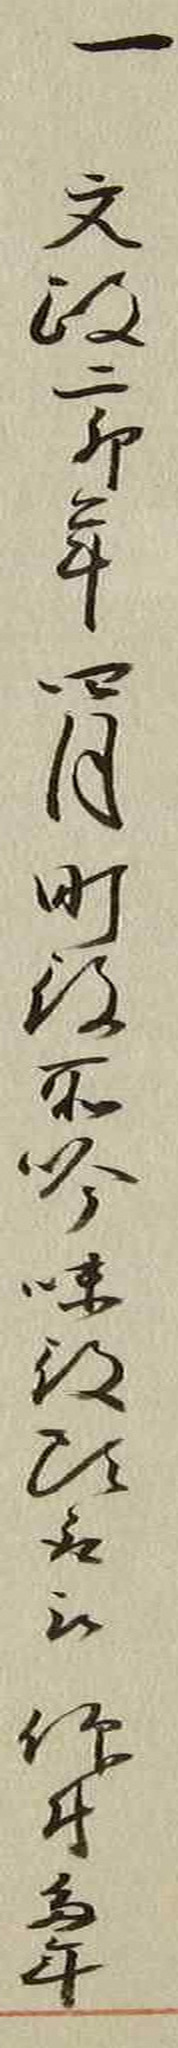一文政二卯年四月町役所吟味役頭取被仰付多年
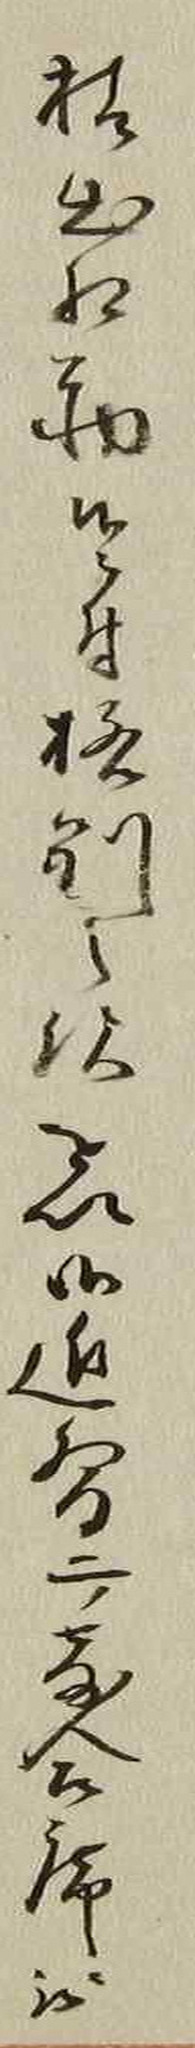精出相勤候ニ付格別之訳を以御近習二ノ寄合席ニ被
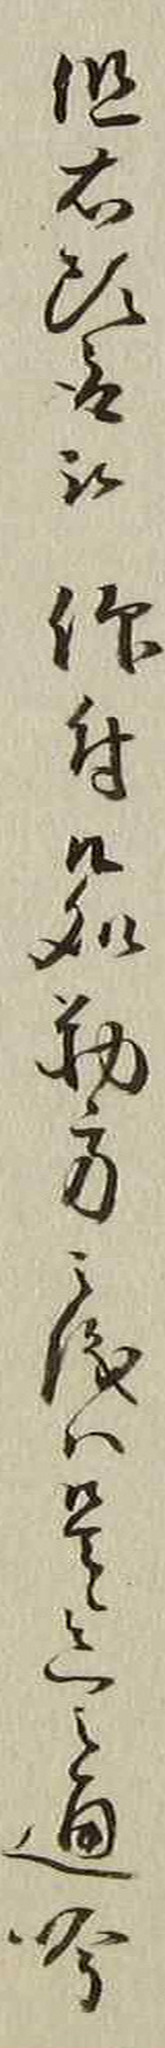但右頭取被仰付候処勤方之儀は是迄之通吟
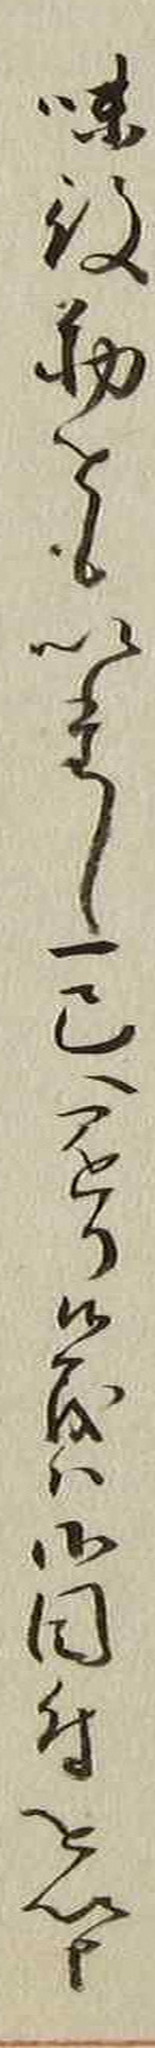味役勤をもいたし一己へ懸り候義は御目付を以申
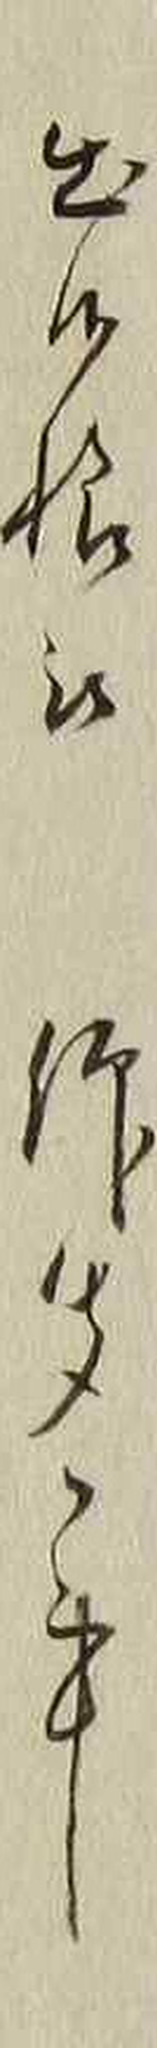出候様被仰聞候事
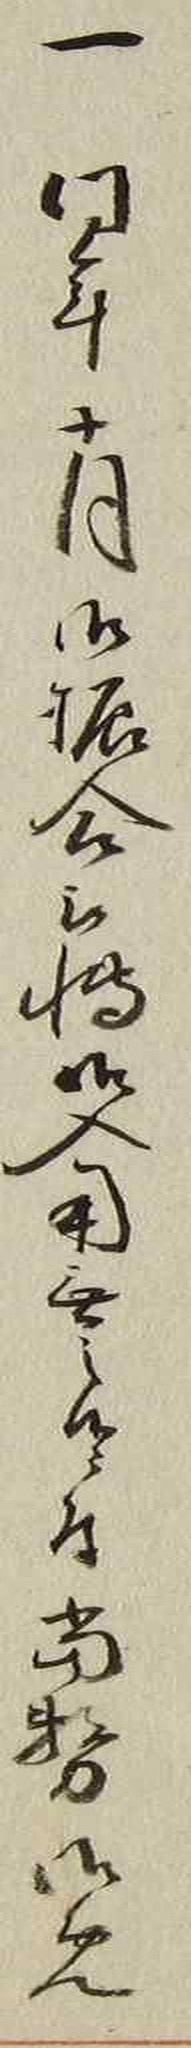一同年十月御振合被転御入用無之候ニ付当務御免
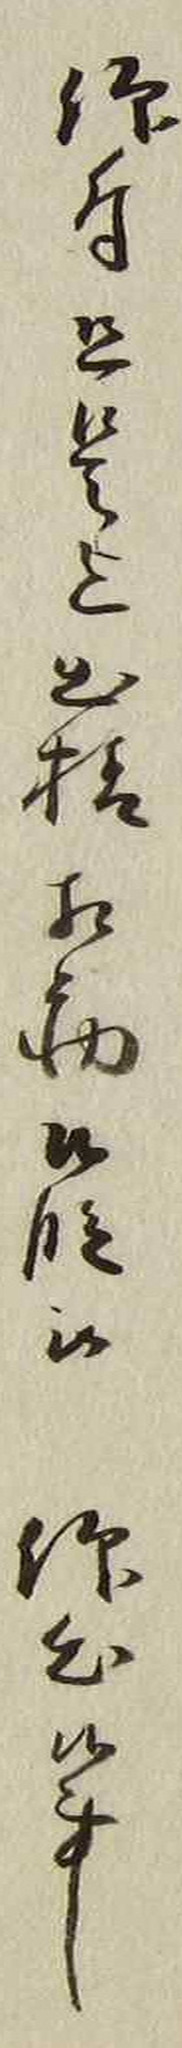仰付且是迄出精相勤候段被仰出候事
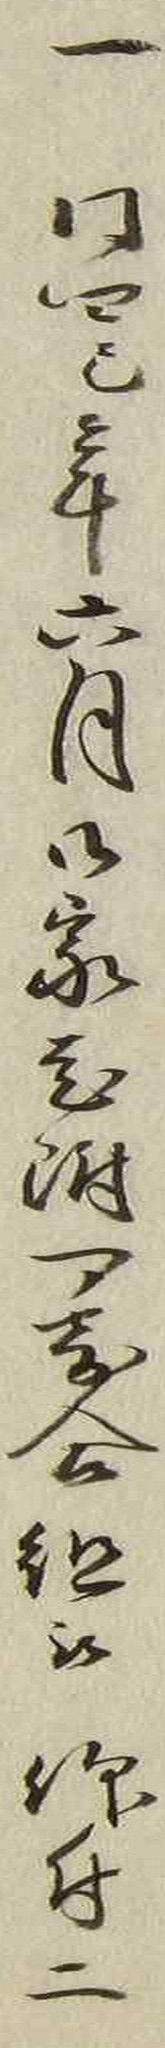一同四巳年六月御家老附一ノ寄合組被仰付二

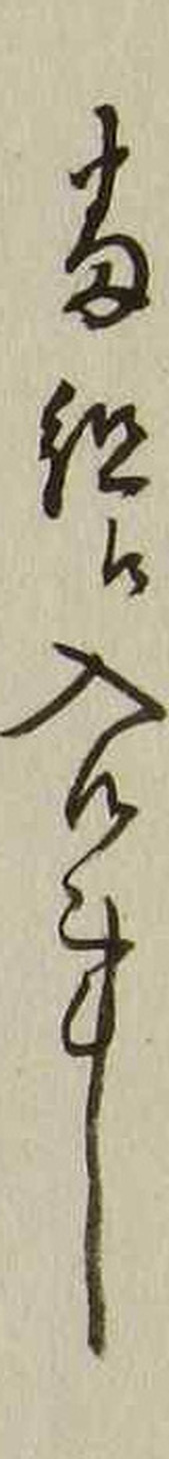番組江入候事
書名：諸士系譜　巻之32　い之部32
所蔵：会津若松市立会津図書館
